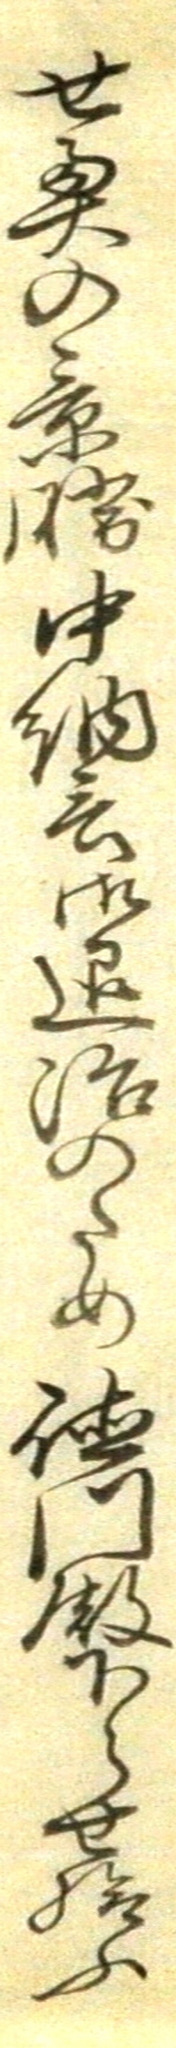せ奥の景勝中納言御退治のため徳川殿下らせ給ふ
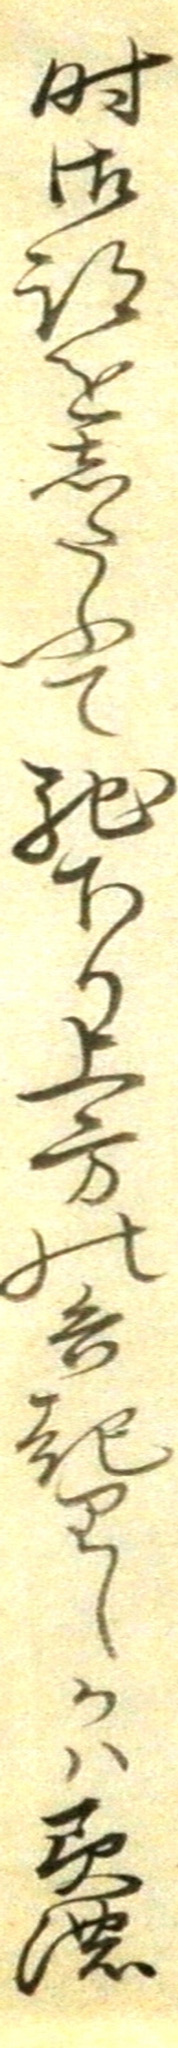時御跡をしたふて馳下り上方の兵起りしかは美濃
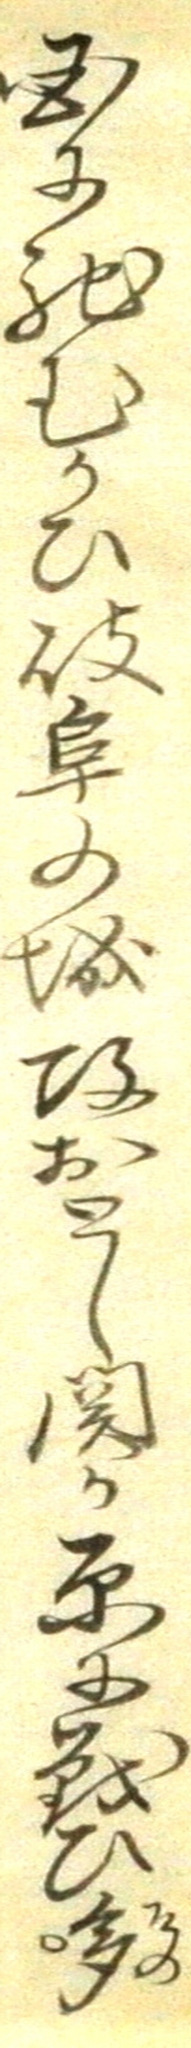国に馳むかひ岐阜の城攻おとし関ヶ原に戦ひ多
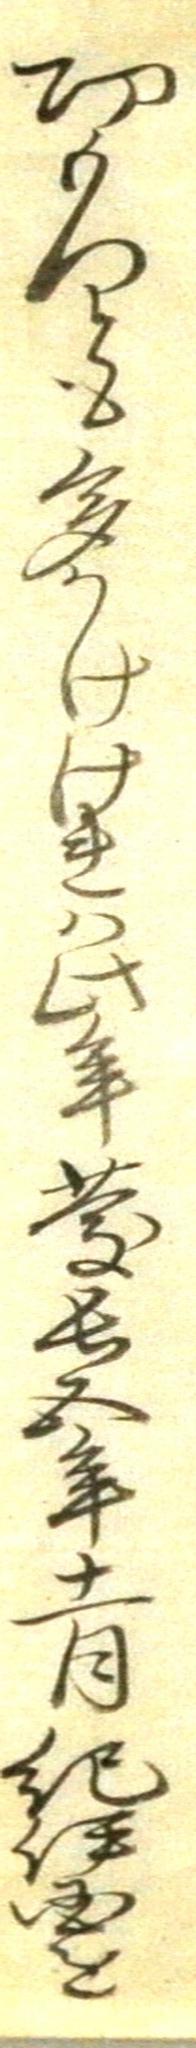功もつとも多かけけれは此年慶長五年十一月紀伊国を
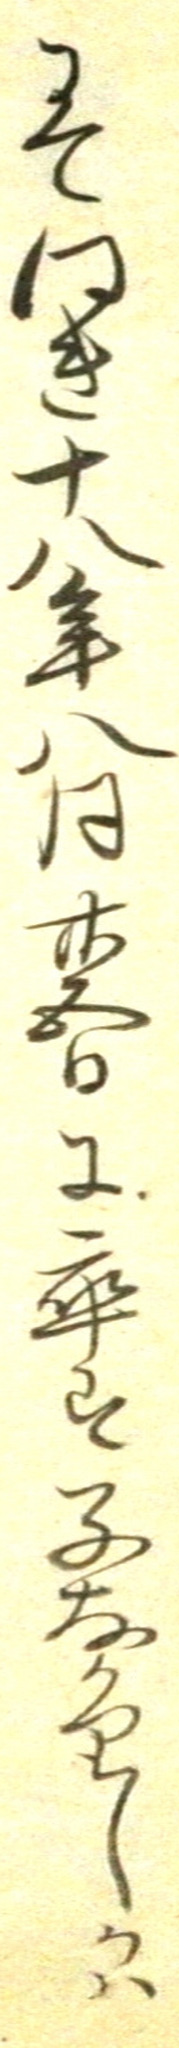にて同き十八年八月廿五日に卒す子なかりしかは
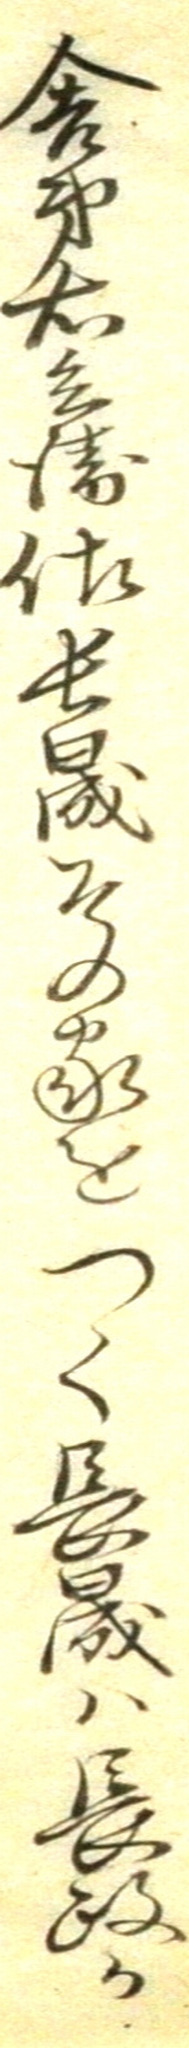舎弟右兵衛佐長晟その家をつく長晟は長政か
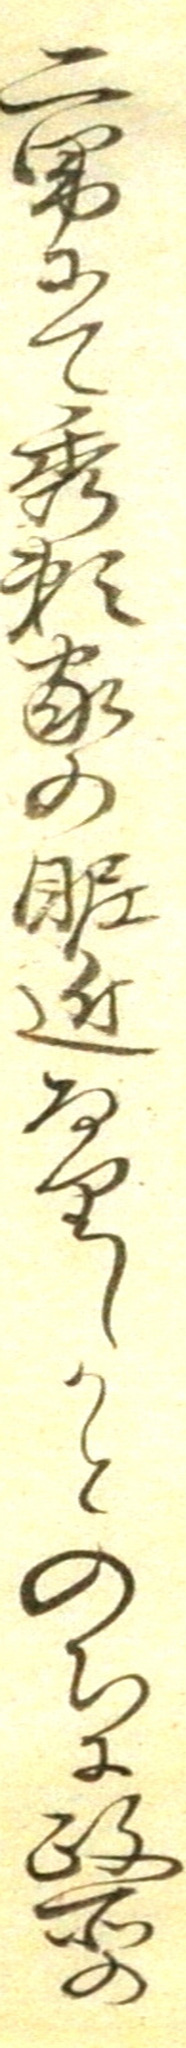二男にて秀頼家の昵近なりしかとのちに政所の
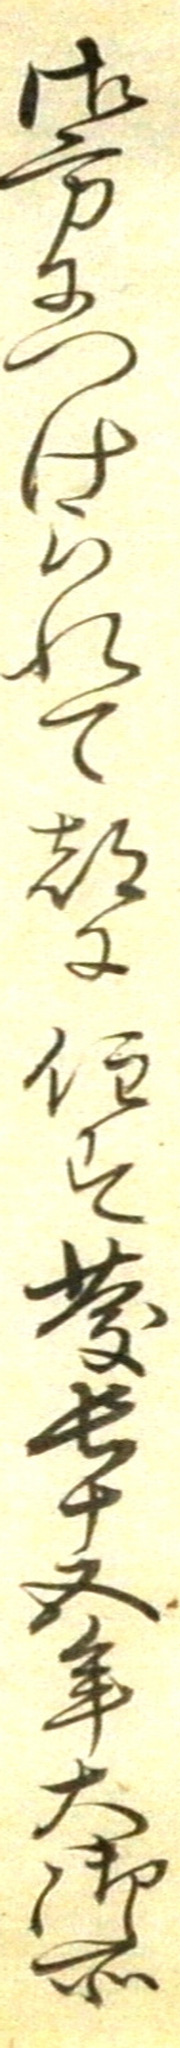御方につけられて都に住す慶長十五年大御所
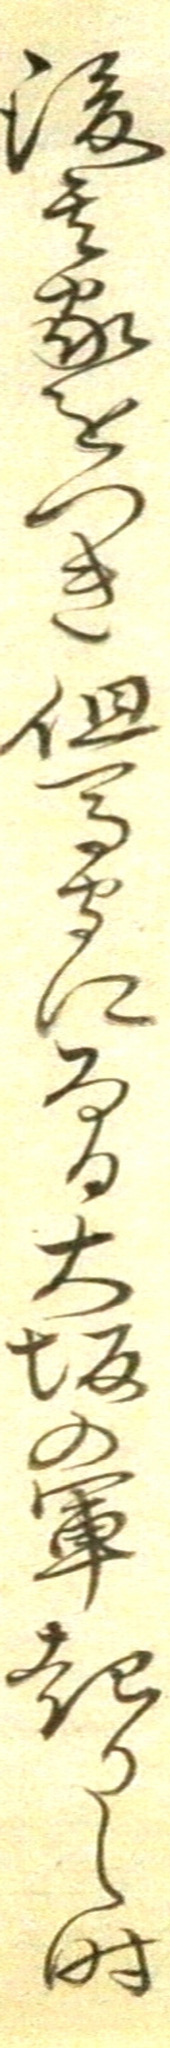後其家をつき但馬守になる大坂の軍起りし時
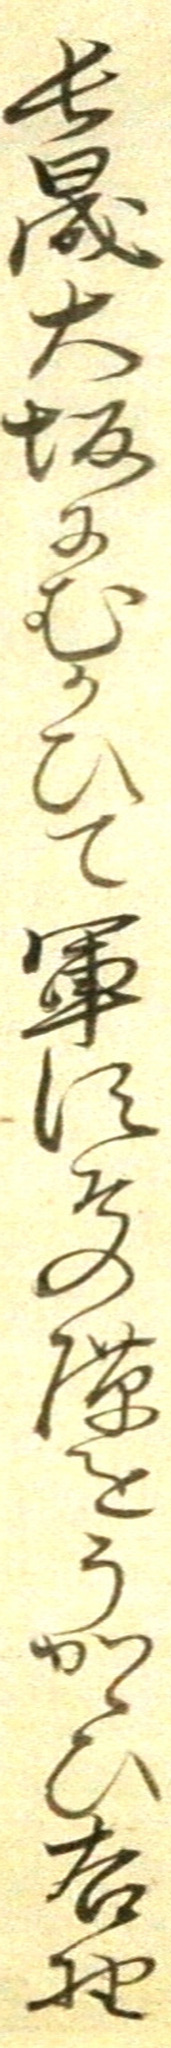長晟大坂にむかひて軍すその隙をうかゝひ吉野
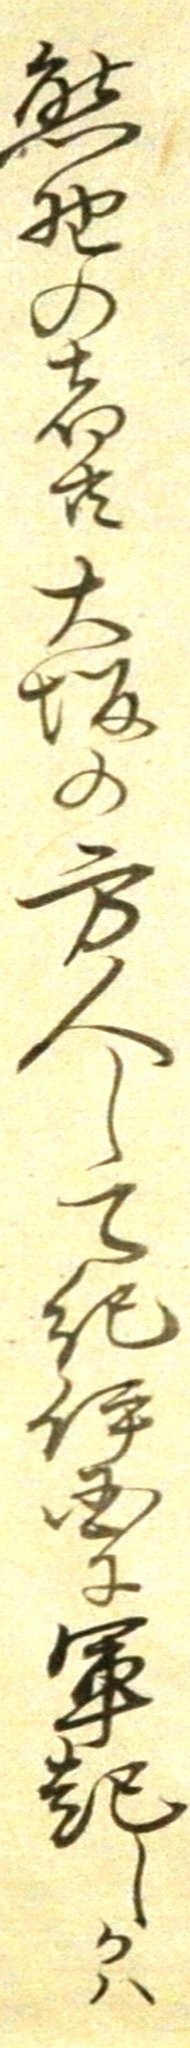熊野の者共大坂の方人して紀伊国に軍起しかは
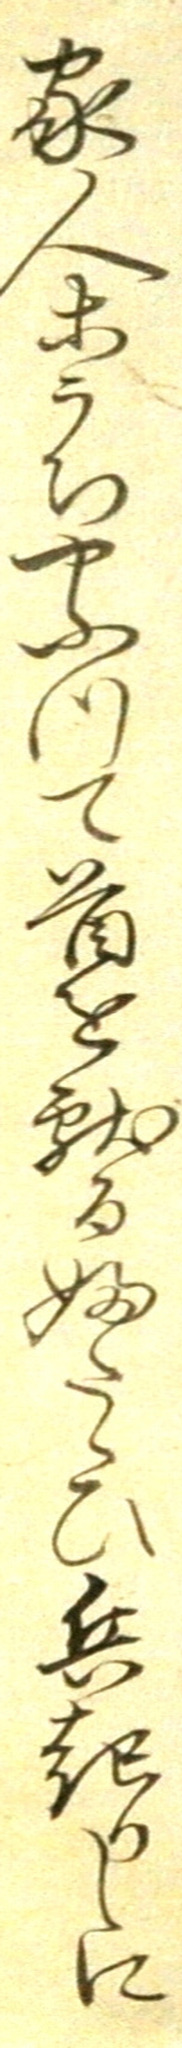家人等うちやふつて首を献るふたゝひ兵起りしに
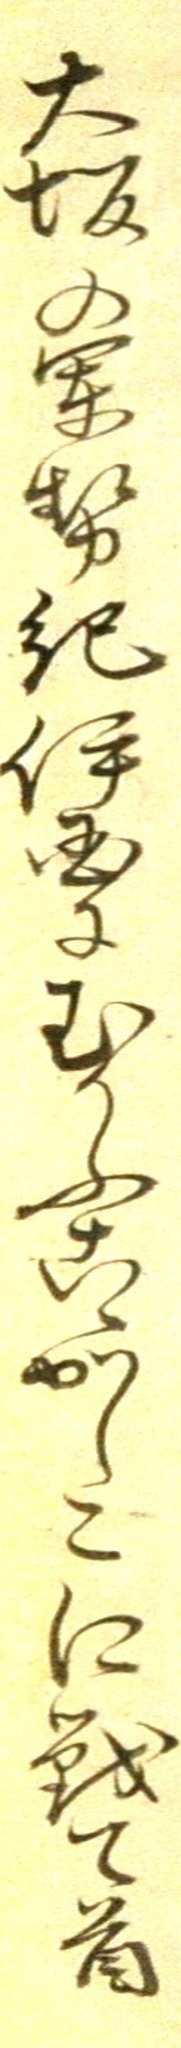大坂の軍勢紀伊国にむかふこゝかしこに戦て首

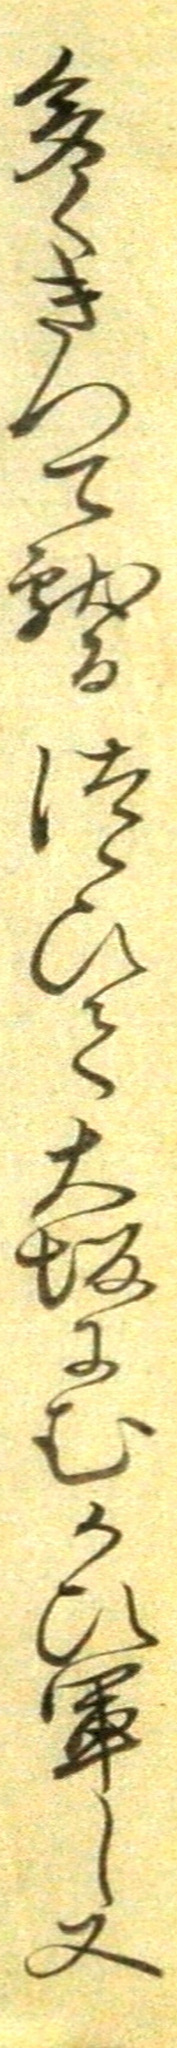多くきつて献るつゝひて大坂にむかひ軍し又
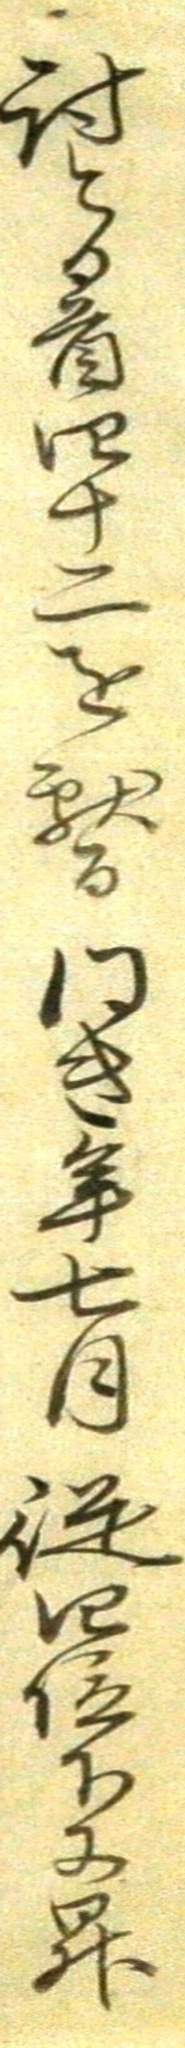討とる首四十二を献る同き年七月従四位下に昇
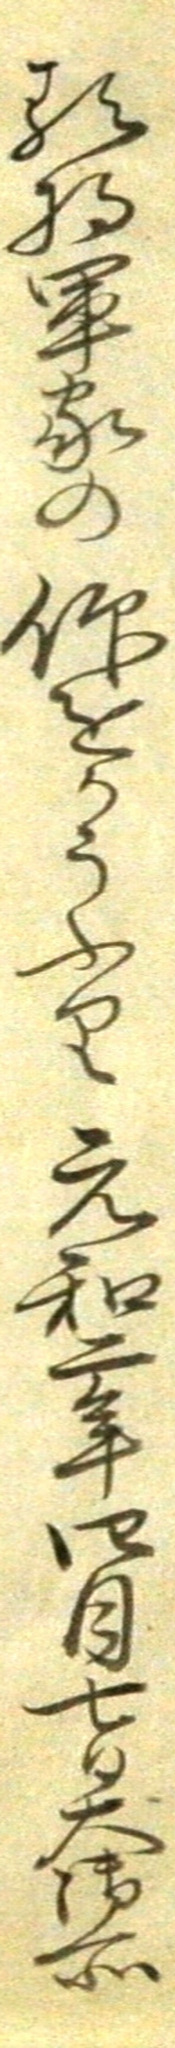る将軍家の仰をかうふり元和二年四月七日大御所
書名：藩翰譜（七・上）
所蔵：伊那市立高遠町図書館・合同会社AMANE
